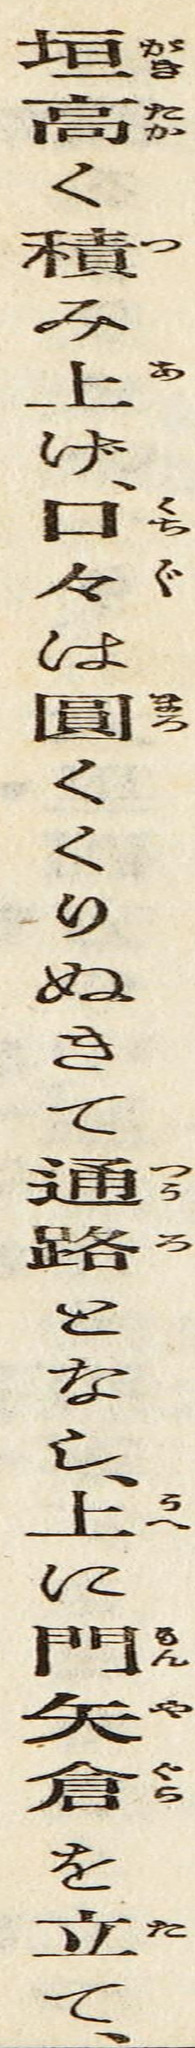垣高く積み上げ、口々は円くくりぬきて通路となし、上に門矢倉を立て、
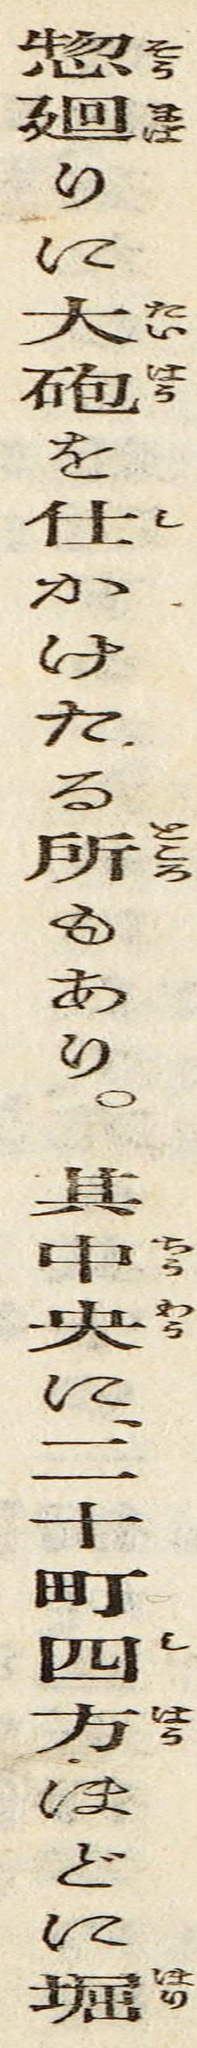総廻りに大砲を仕かけたる所もあり。其中央に、二十町四方ほどに堀
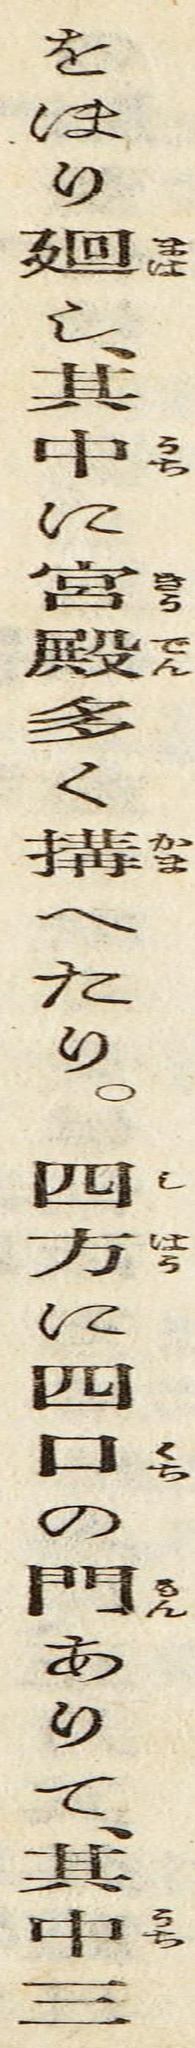をほり廻し、其中に宮殿多く構へたり。四方に四口の門ありて、其中三
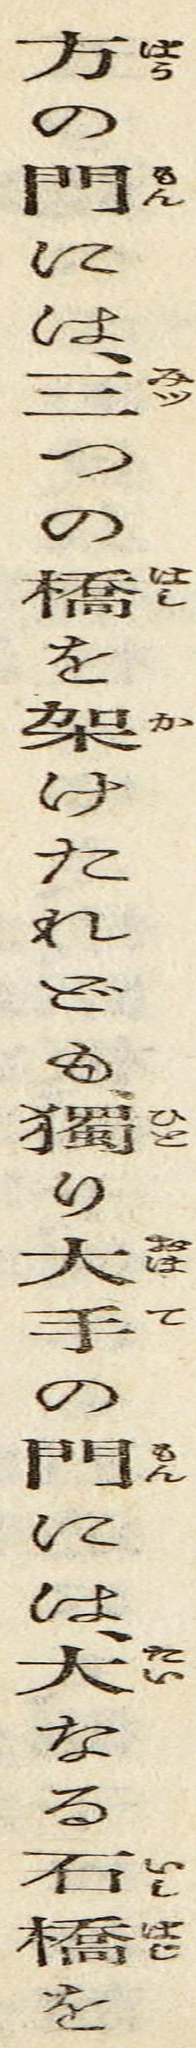方の門には、三つの橋を架けたれども、独り大手の門には、大なる石橋を

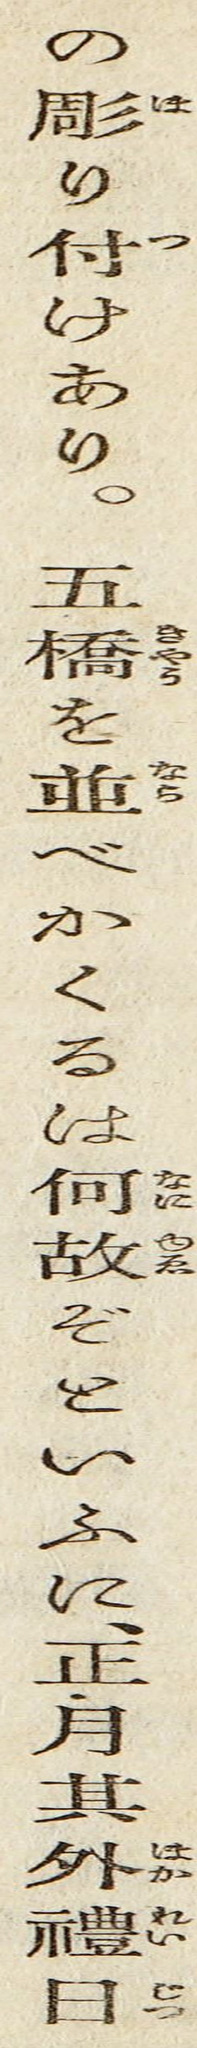の彫り付けあり。五橋を並べかくるは何故ぞといふに、正月其外礼日
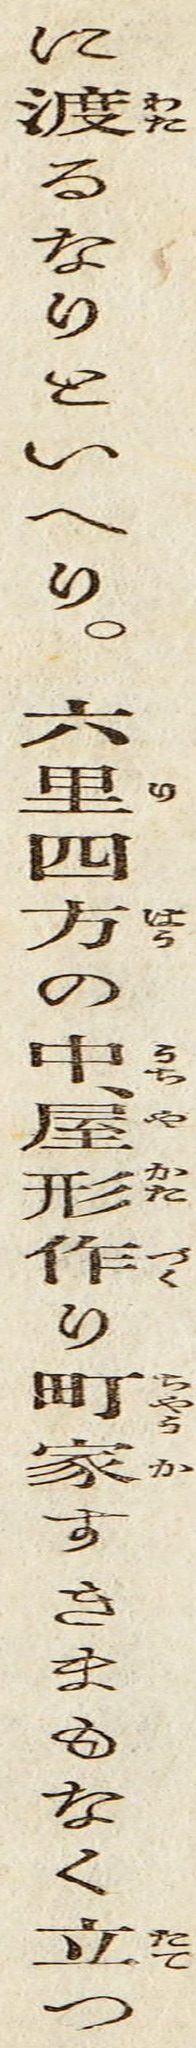に渡るなりといへり。六里四方の中、屋形作り町家すきまもなく立つ
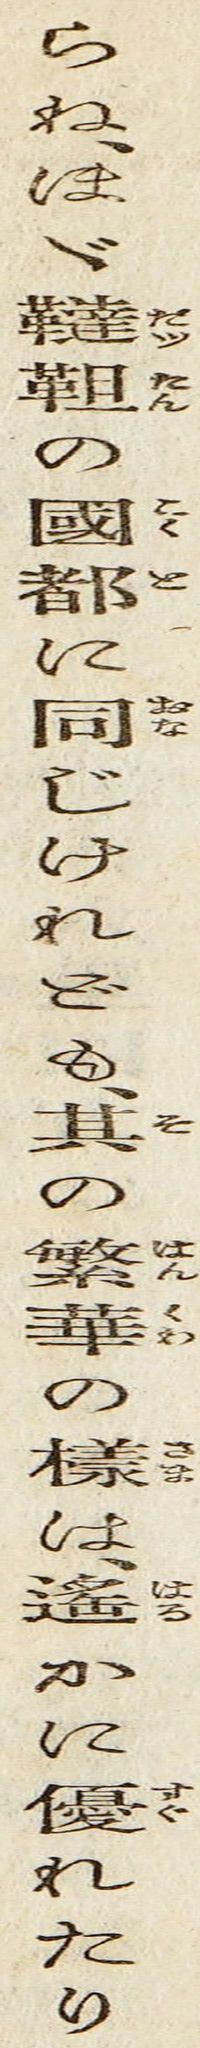らね、ほヾ韃靼の国都に同じけれども、其の繁華の様は、遥かに優れたり
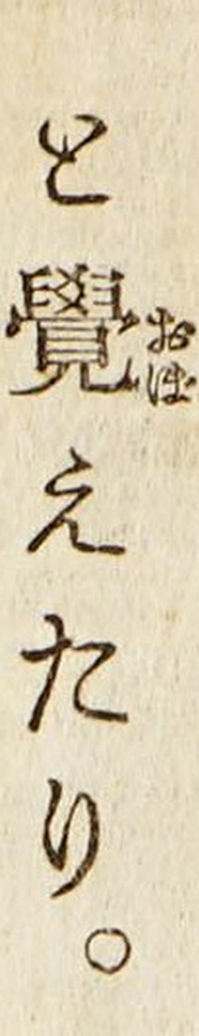と覚えたり。
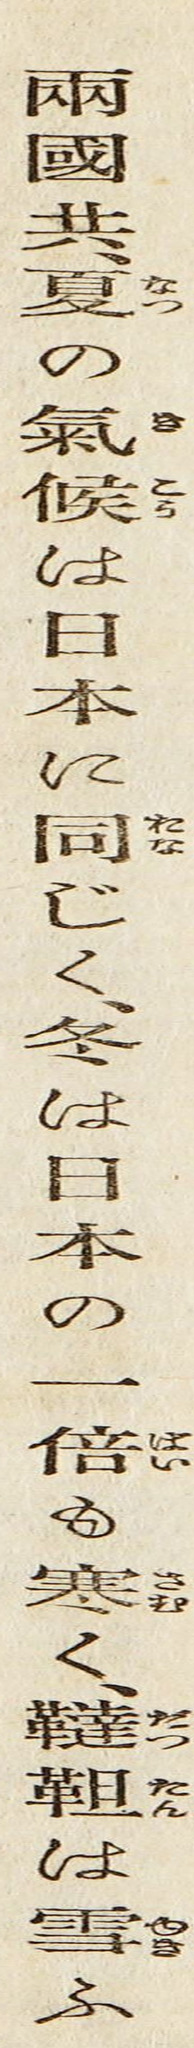両国共、夏の気候は日本に同じく、冬は日本の一倍も寒く、韃靼は雪ふ
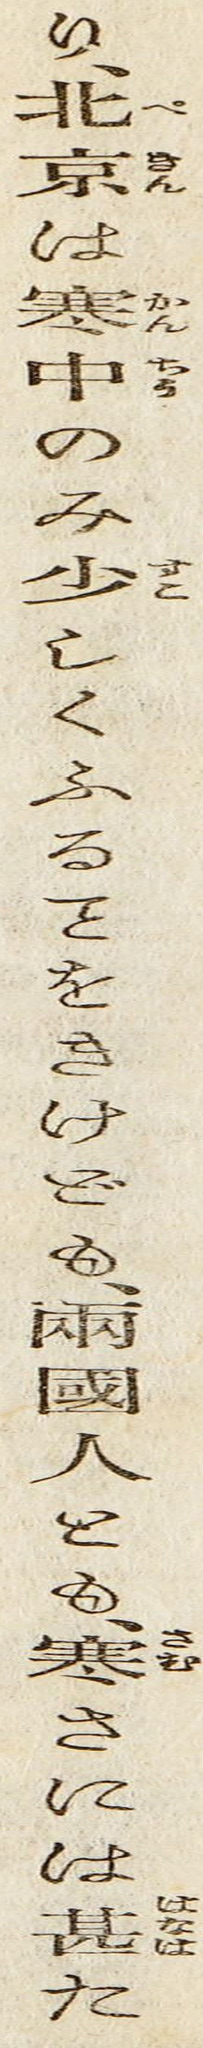り、北京は寒中のみ少しくふることをきけども、両国人とも、寒さには甚た
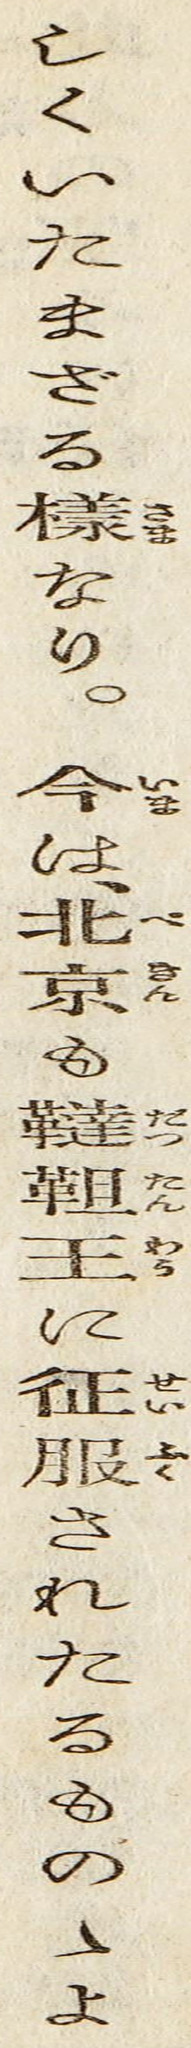しくいたまざる様なり。今は、北京も韃靼王に征服されたるものゝよ
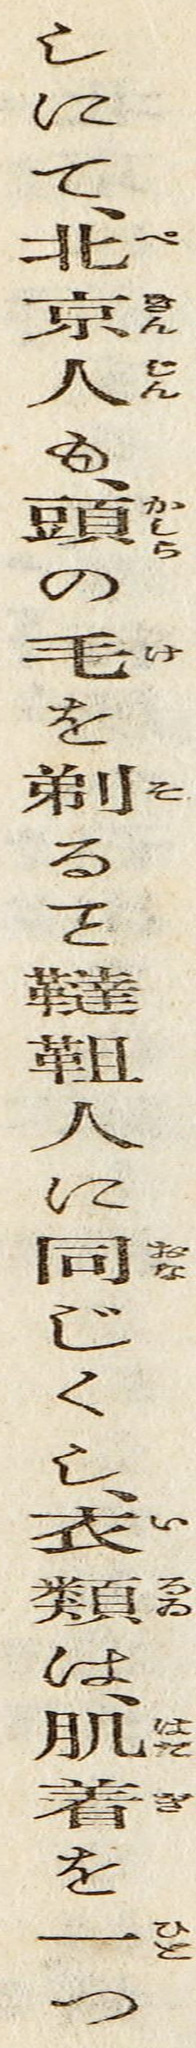しにて、北京人も、頭の毛を剃ること韃靻人に同じくし、衣類は、肌着を一つ
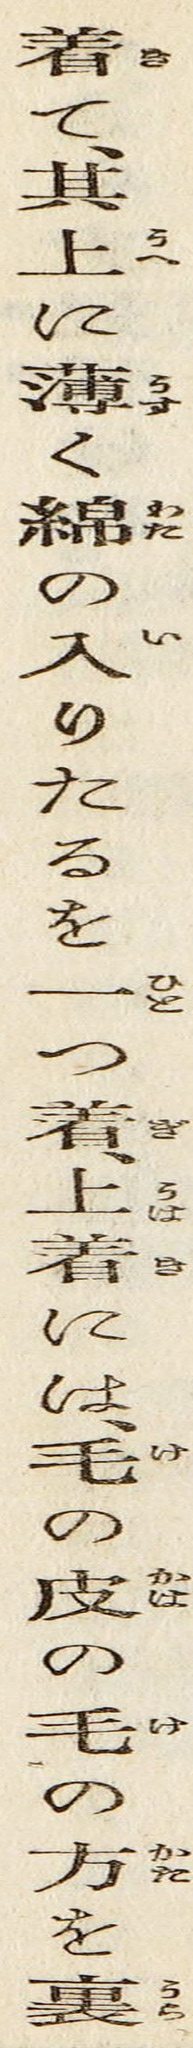着て、其上に薄く綿の入りたるを一つ着、上着には、毛の皮の毛の方を裏
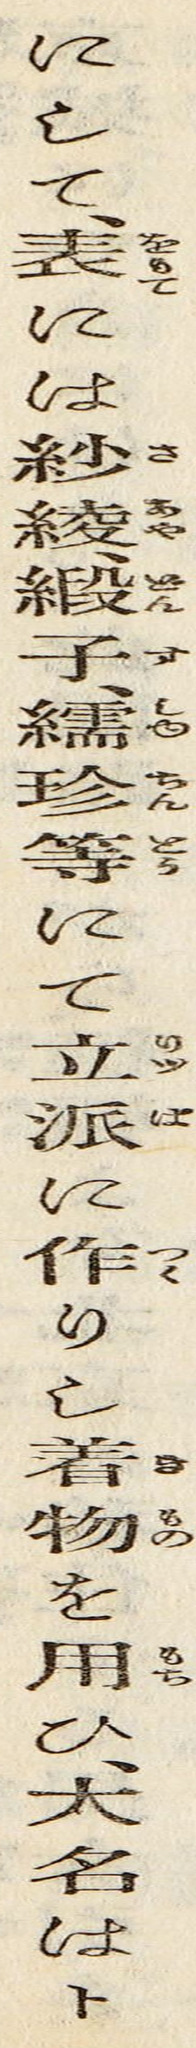にして、表には紗綾、緞子、繻珍等にて立派に作りし着物を用ひ、大名はト
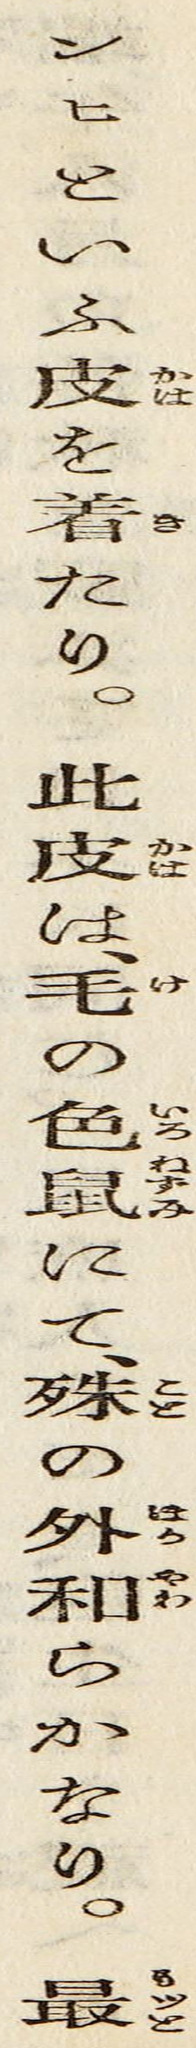ンヒといふ皮を着たり。此皮は、毛の色鼠にて、殊の外和らかなり。最
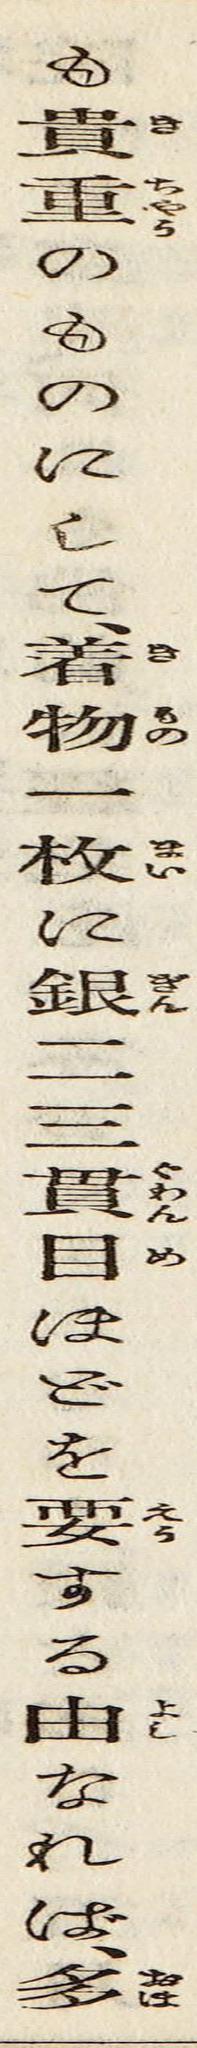も貴重のものにして、着物一枚に銀二三貫目ほどを要する由なれば、多
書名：日本漂流譚
